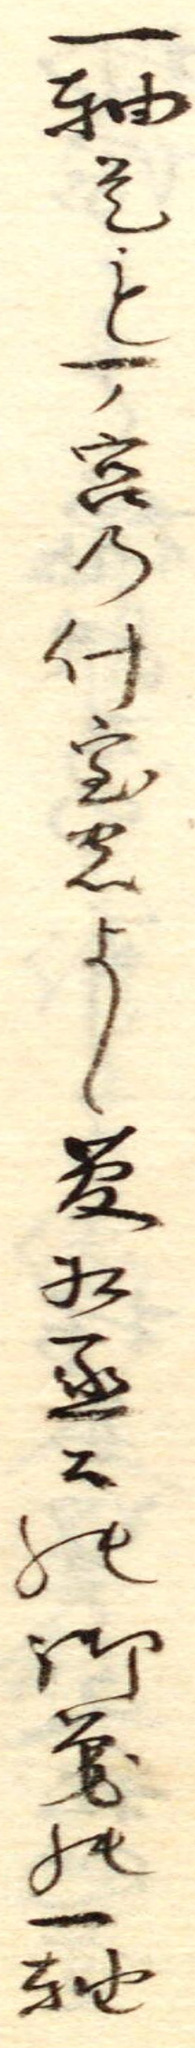一軸是も一ノ宮の什宝のよし菅相丞公の御筆の一軸
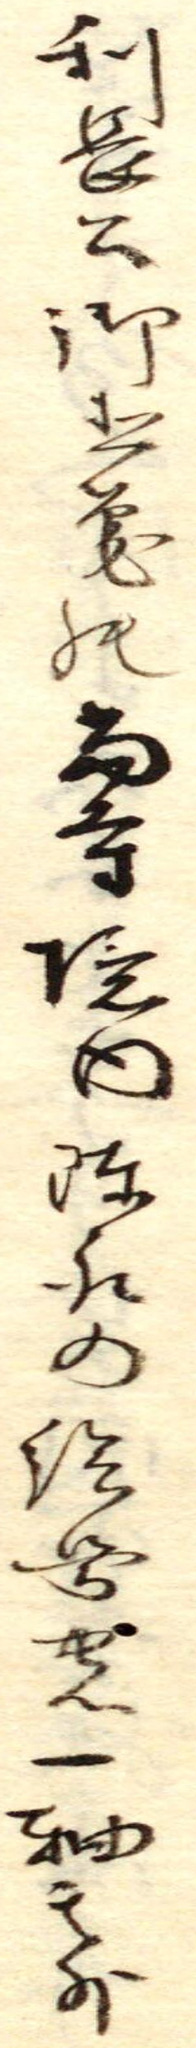利長公御直筆の当寺境内陣取の絵図の一軸其外
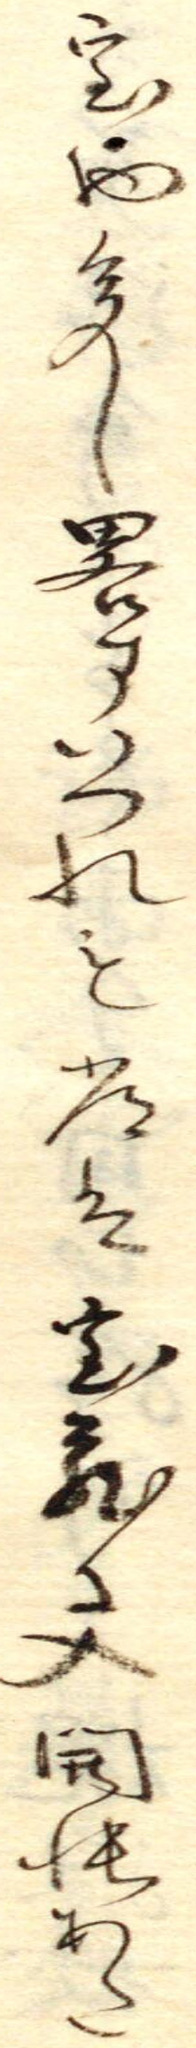宝物多し略すいつれも常は宝蔵に入開帳あた
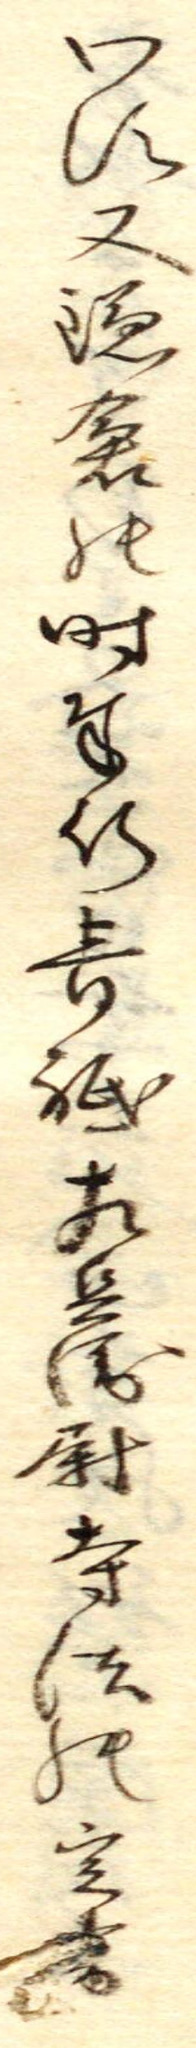はす又隠倉の時奉行青袛相兵衛寺伝の定書

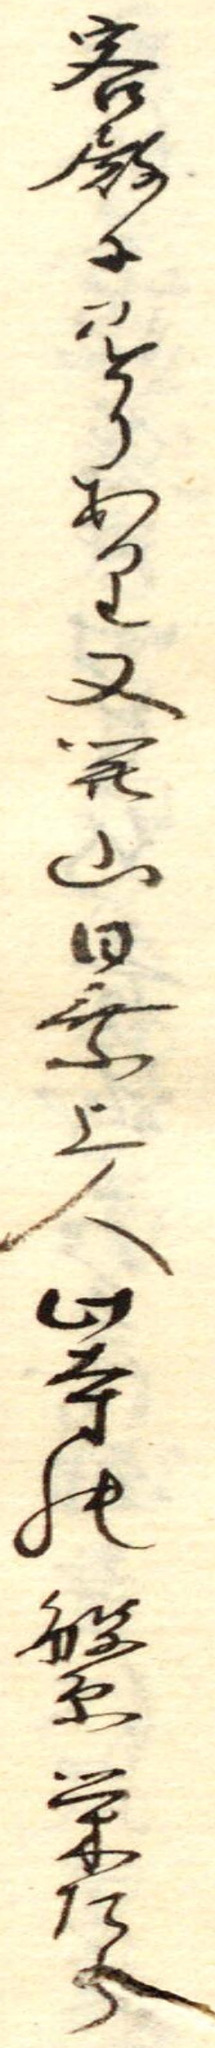客殿に懸りあり又開山日乗上人此寺の繁栄
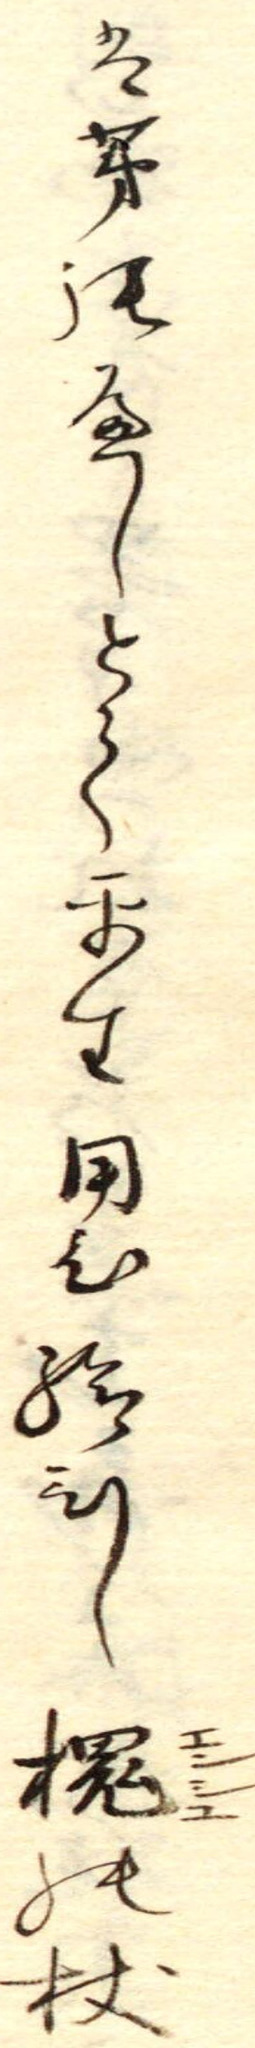は茅張へしとて平生用ひ給ひし槐’の杖
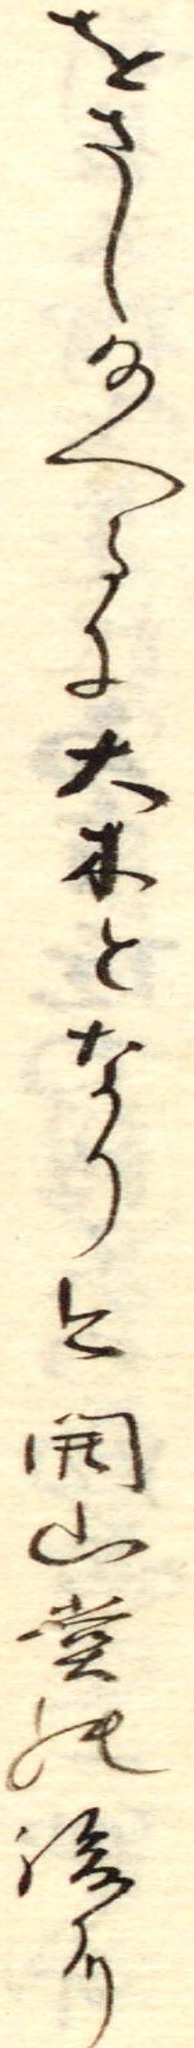をさし給へるに大木となり今開山堂の後に
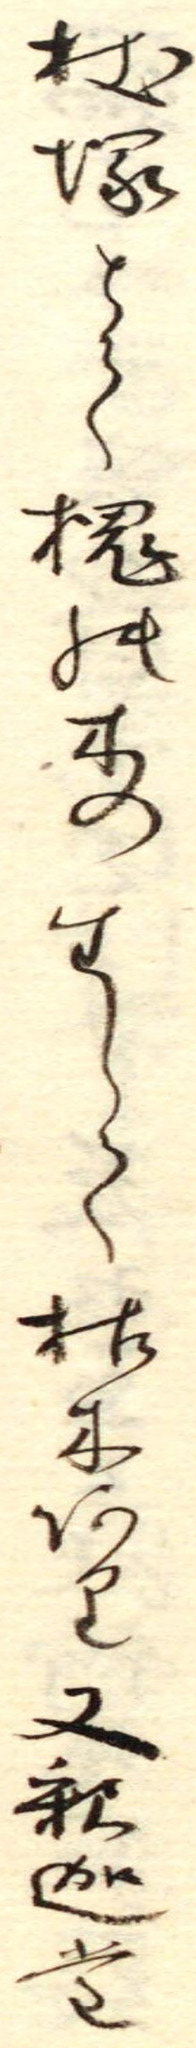杖塚とて槐の木の生して枯木あり又釈迦堂
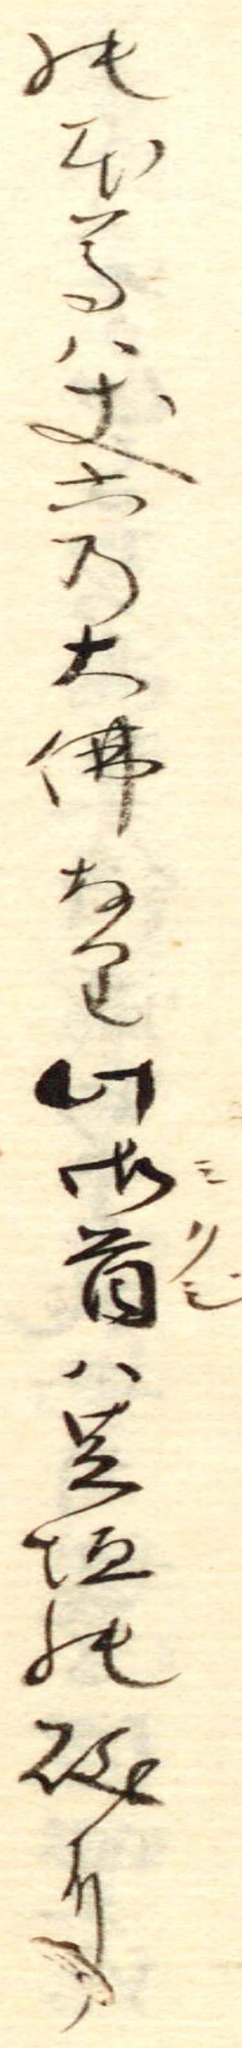の本尊は丈六の大仏なり此御首は足垣の礒に
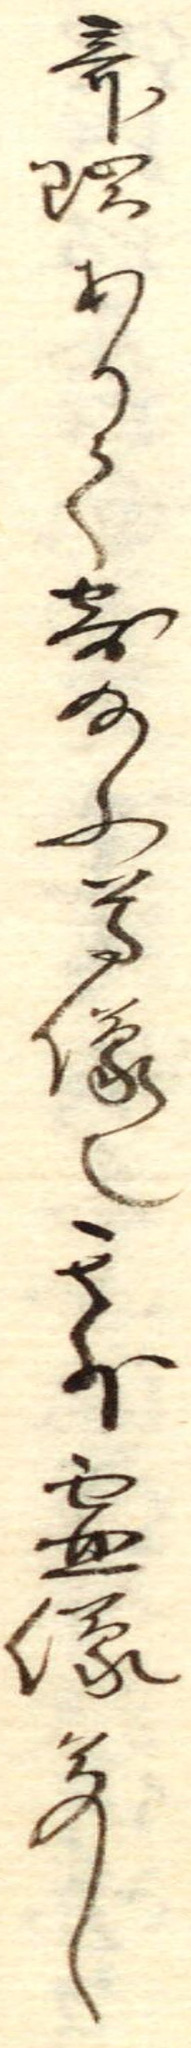奇瑞ありて寄給ふ尊像也其外其外霊像多し
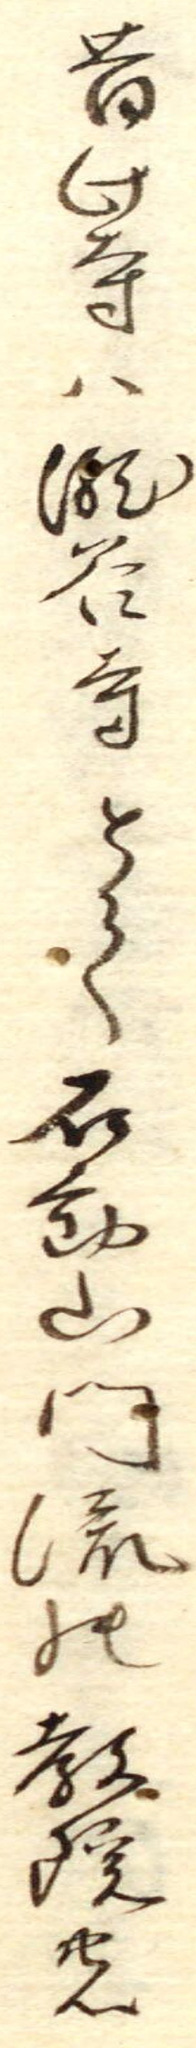昔此寺は瀧谷寺とて石動山門流の教院の
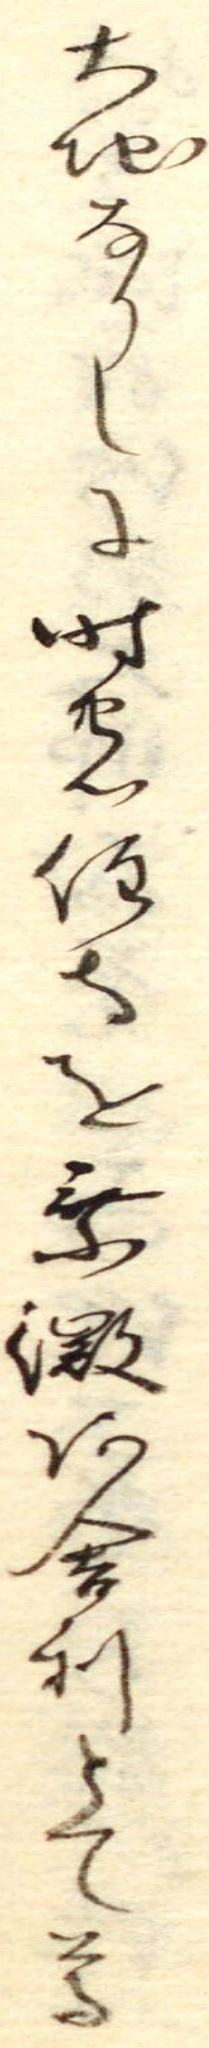大地なりしに時の住を乗徴阿舎利とて尊
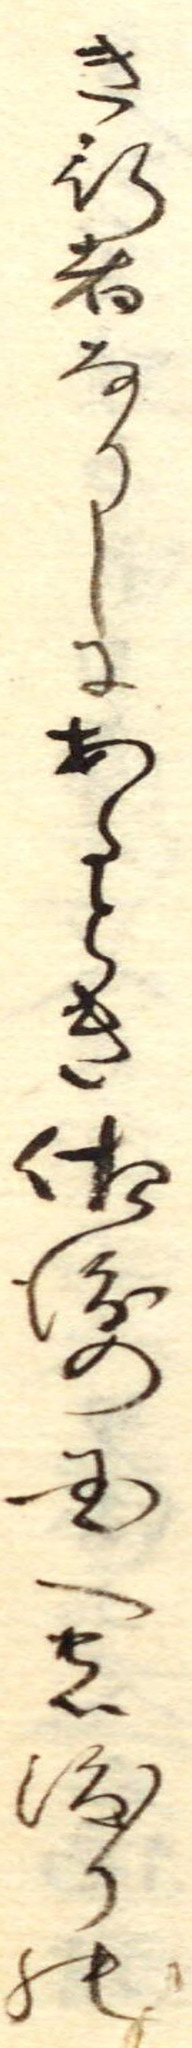き行者なりしにあるとき佐渡の国への渡りの
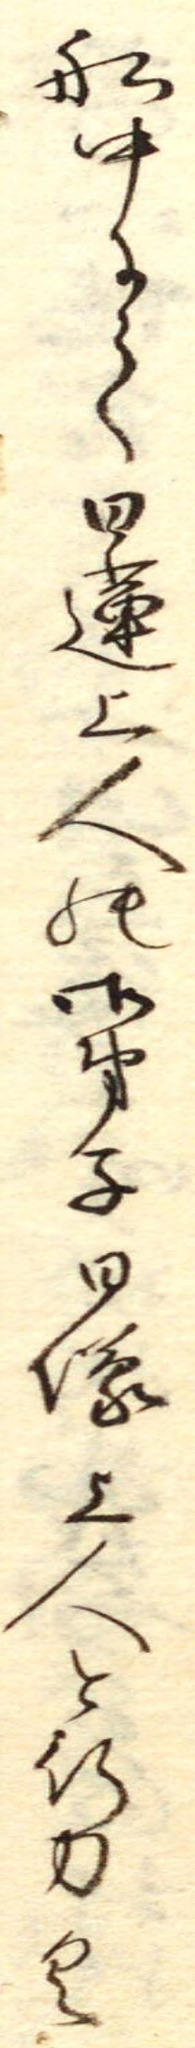船中にて日蓮上人の御弟子日像上人と行力く
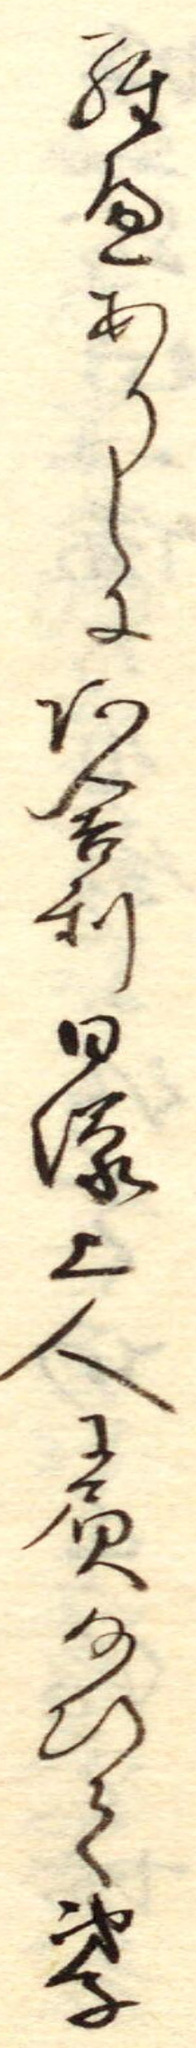らへありしに阿舎利日像上人に負給ひて弟子
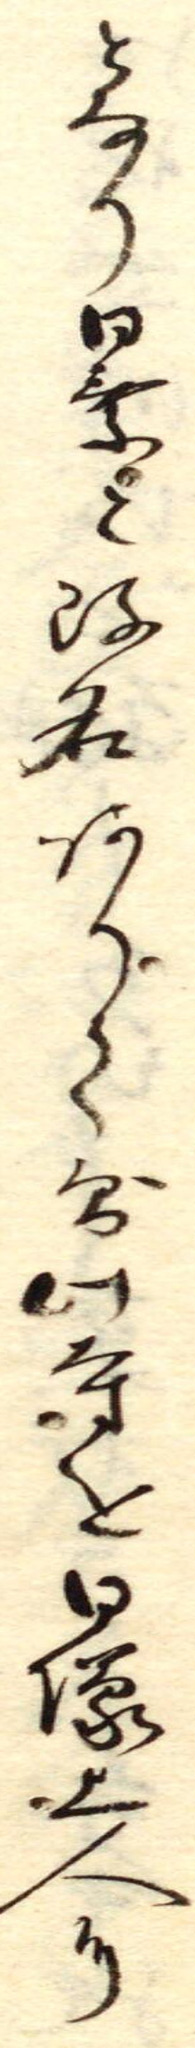となり日乗と改名ありて則此寺を日像上人に
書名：能登名跡誌
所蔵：Ishikawa Prefectural Library
